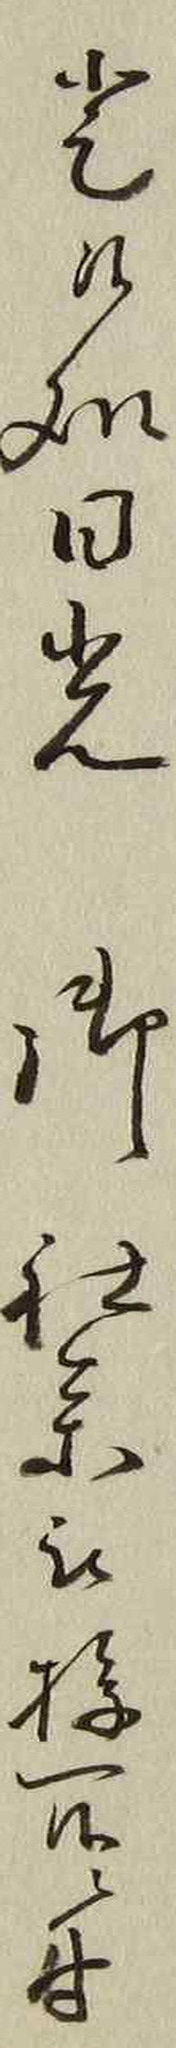登候処日光御社参被遊候に付
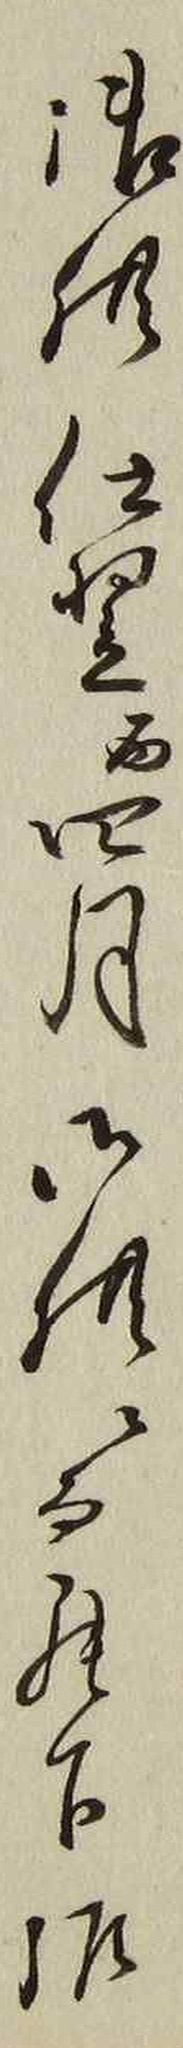御供仕翌酉四月御供に而罷下候
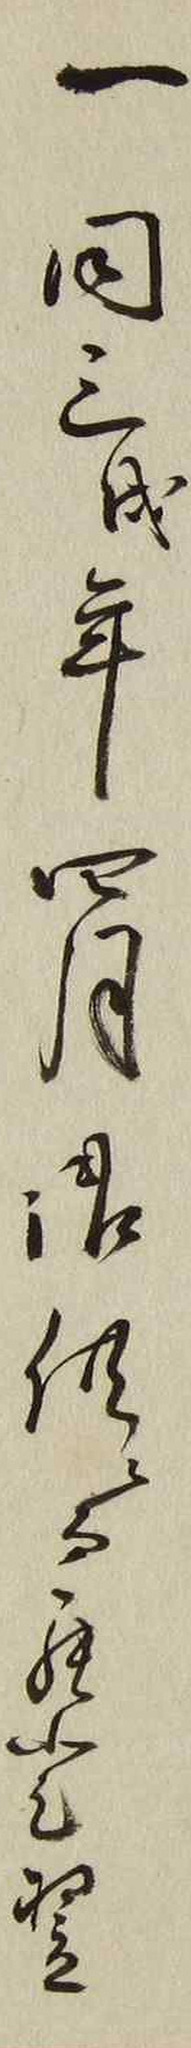一同三戌年四月御供に而罷登翌
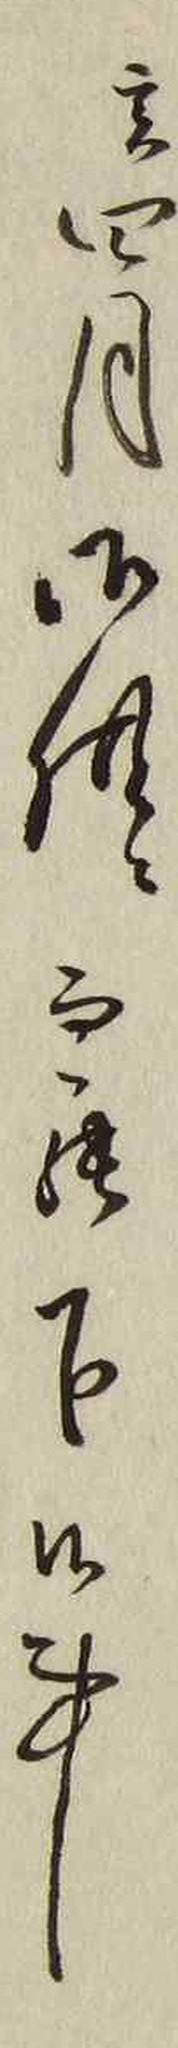亥四月御供に而罷下候事

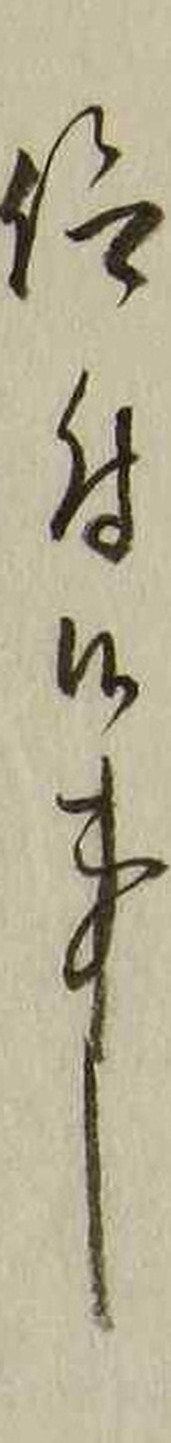仰付候事
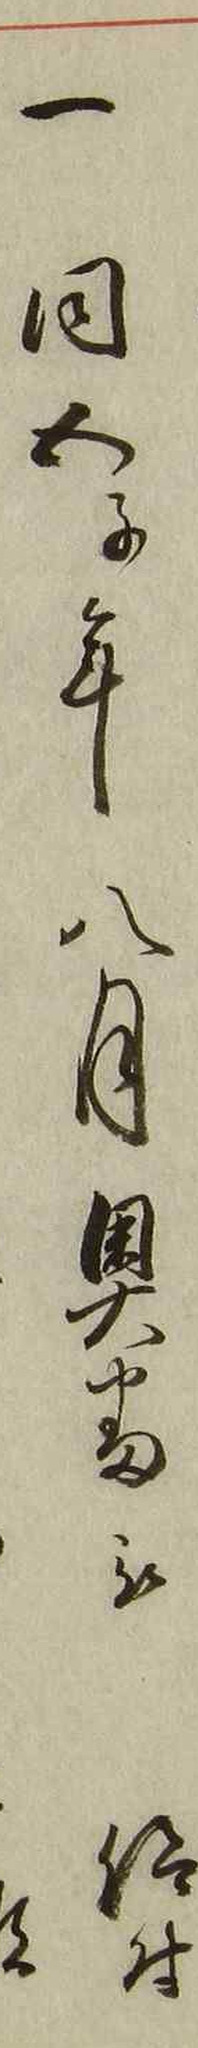一同五子年八月奥番被仰付
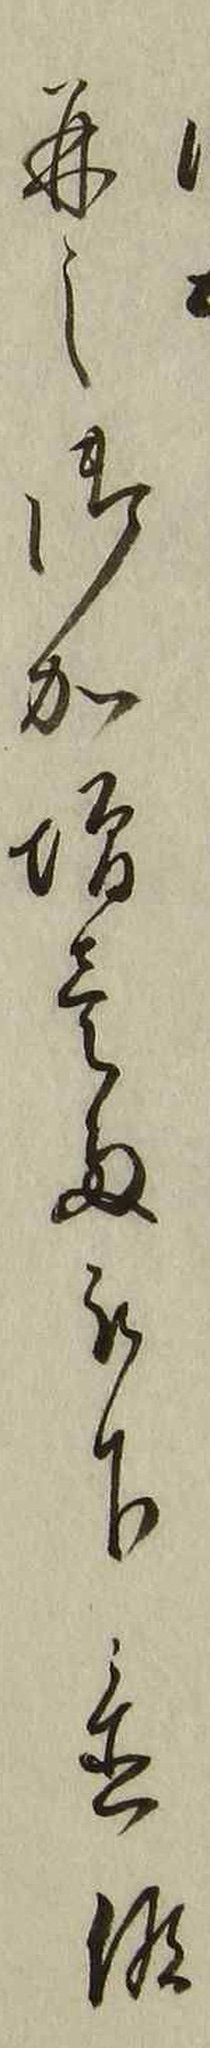再之御加増壱両被下置候
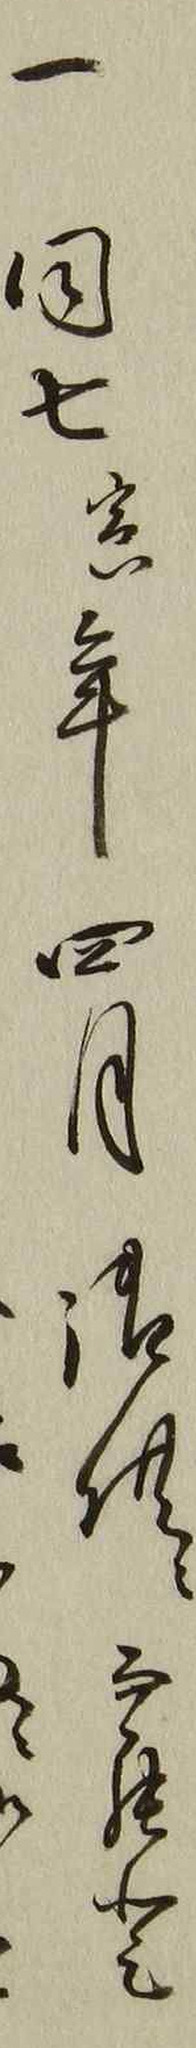一同七寅年四月御供に而罷登
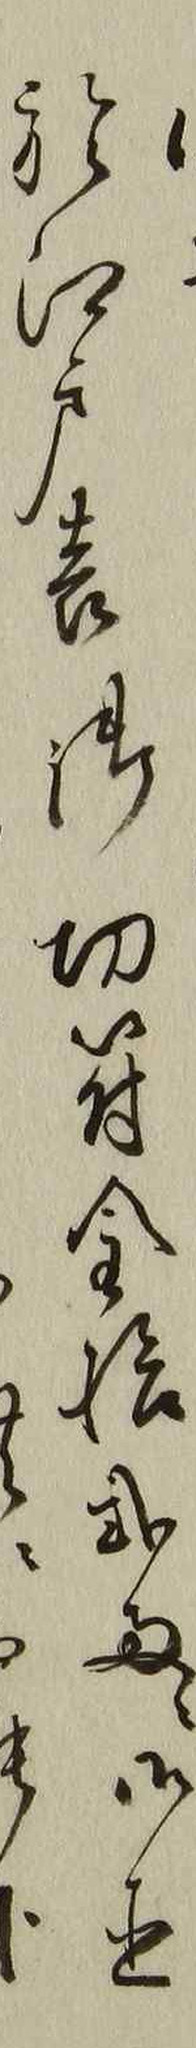於江戸表御切符金拾弐両に御直
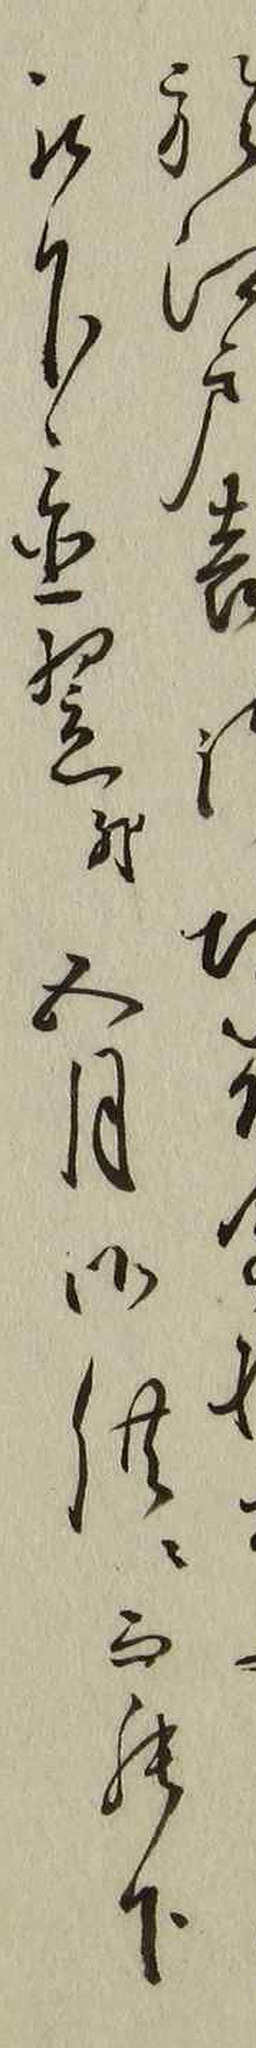被下置翌卯五月御供に而罷下
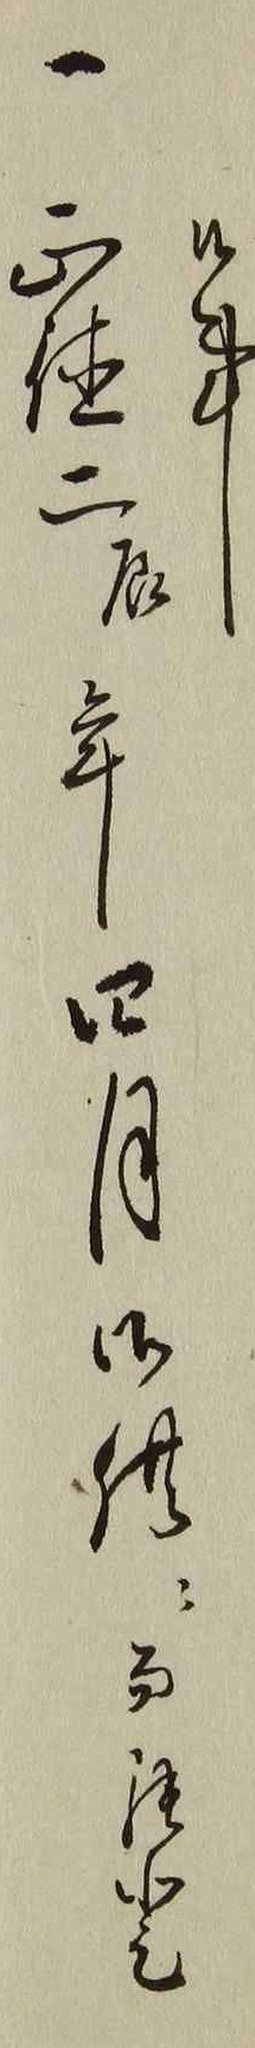一正徳二辰年四月御供に而罷登
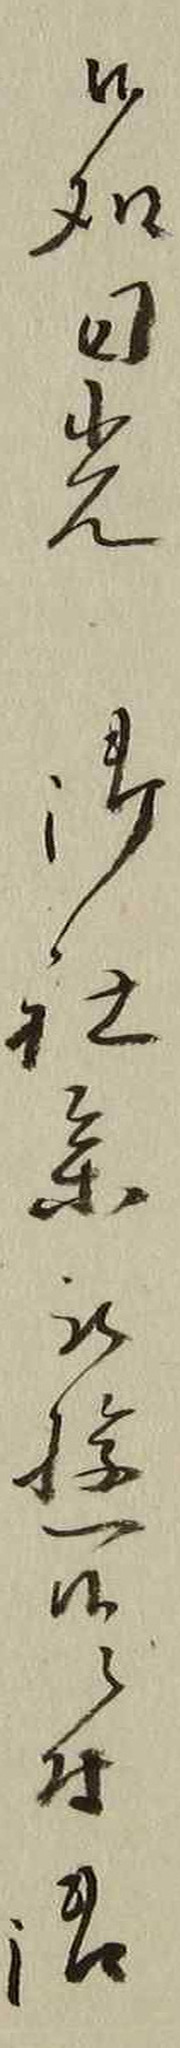候処日光御社参被遊候に付御
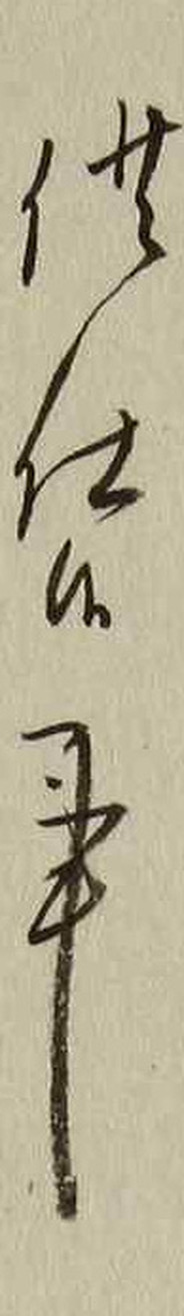供仕候事
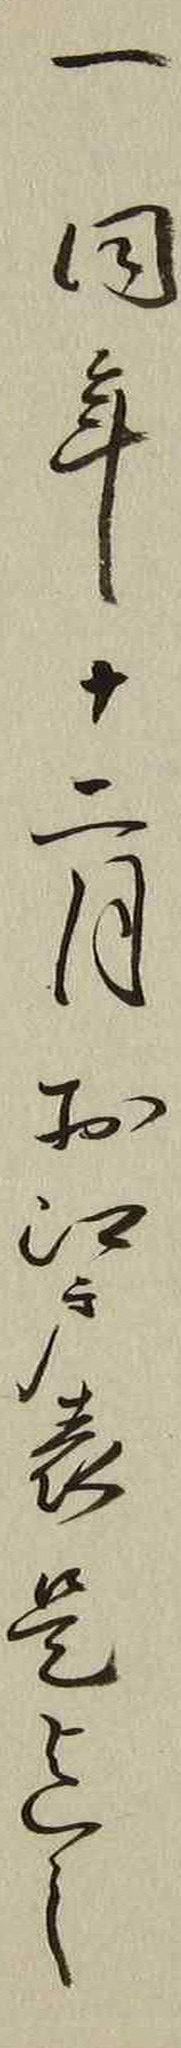一同年十二月於江戸表是迄之
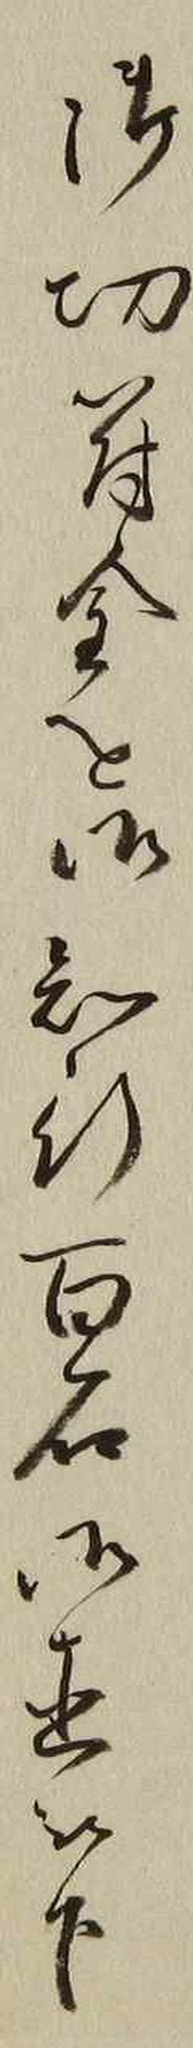御切符金を御知行百石御直被下
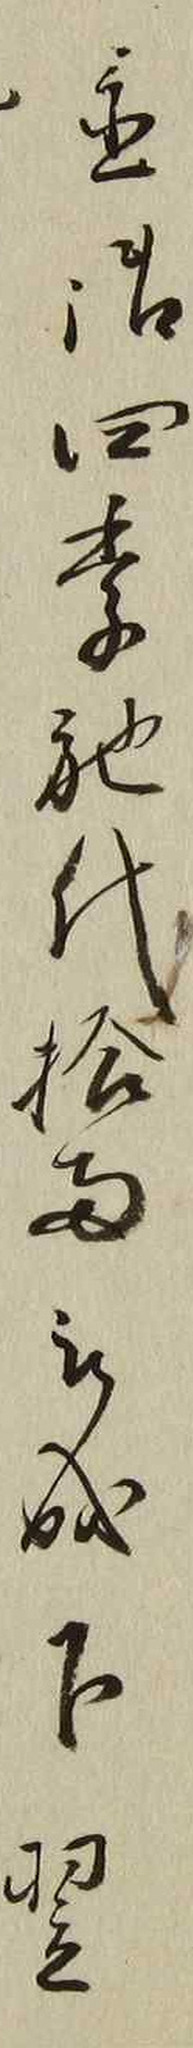置御四季施代拾両被成下翌
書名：諸士系譜　巻之6　い之部6
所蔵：会津若松市立会津図書館
